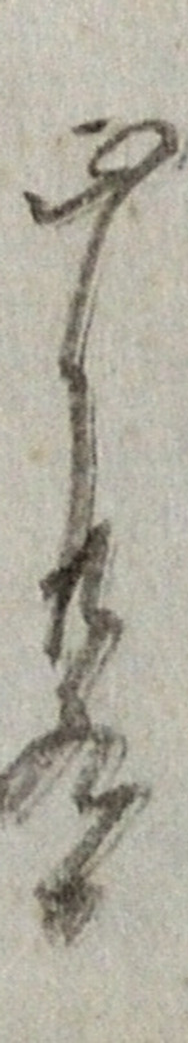正月廿九日
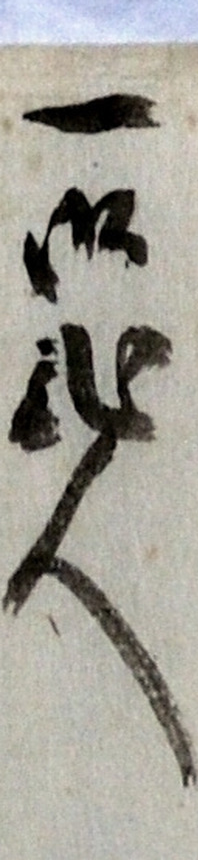一御弐人
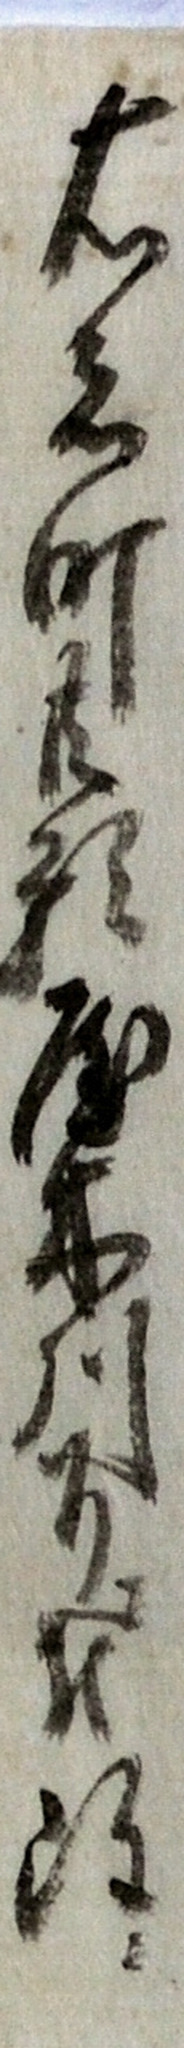右は町共願屋木川下ニ付改ニ
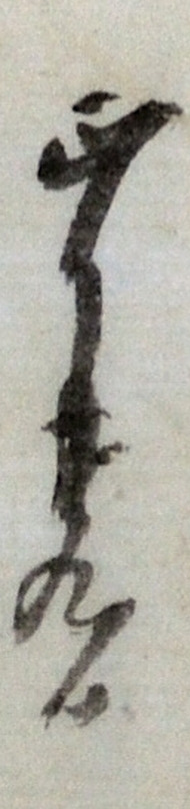正月廿九日

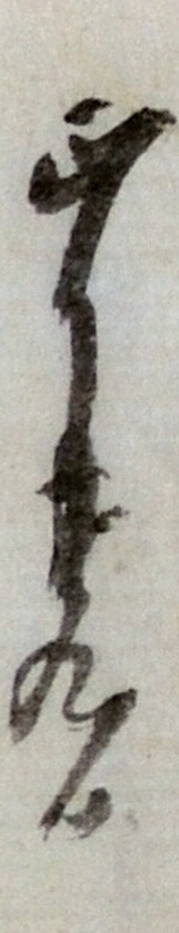正月廿九日
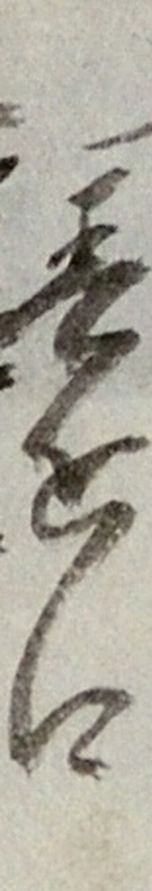春近郷
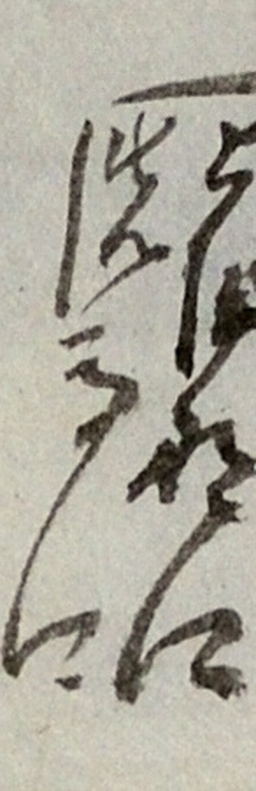洗馬郷
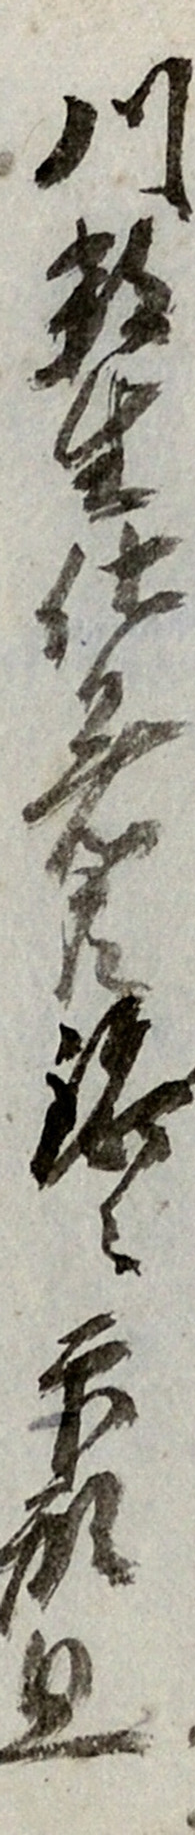川殺生仕候者共銘々印形且
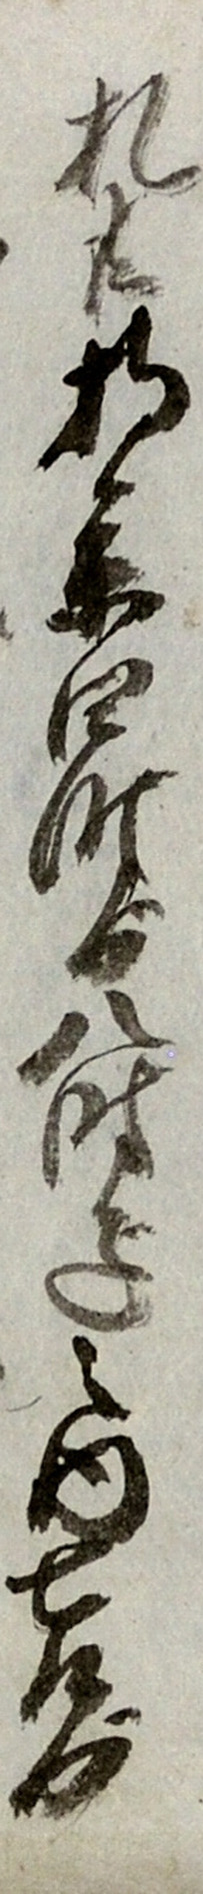札共持参四時ゟ八時迄之内七左衛門
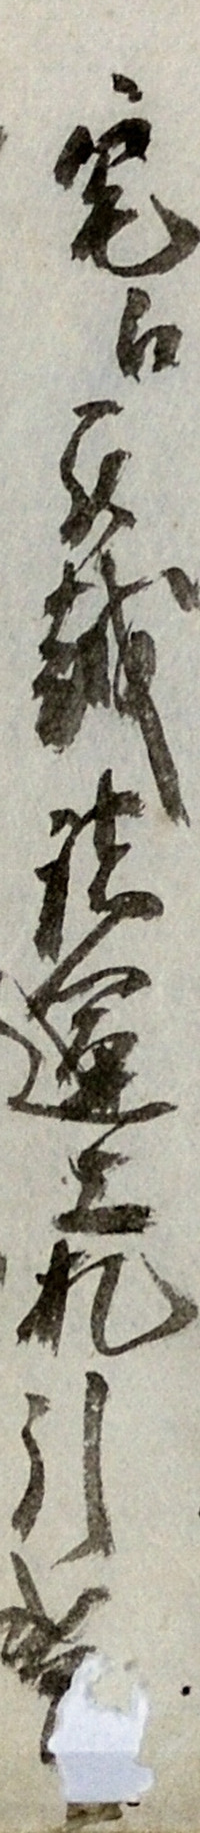宅え罷越諸運上札引替
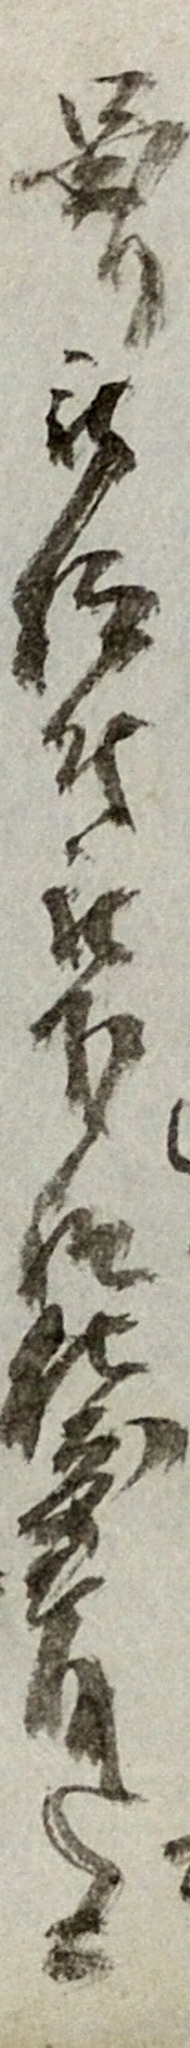図り被仰付被下候様仕度奉存候以上
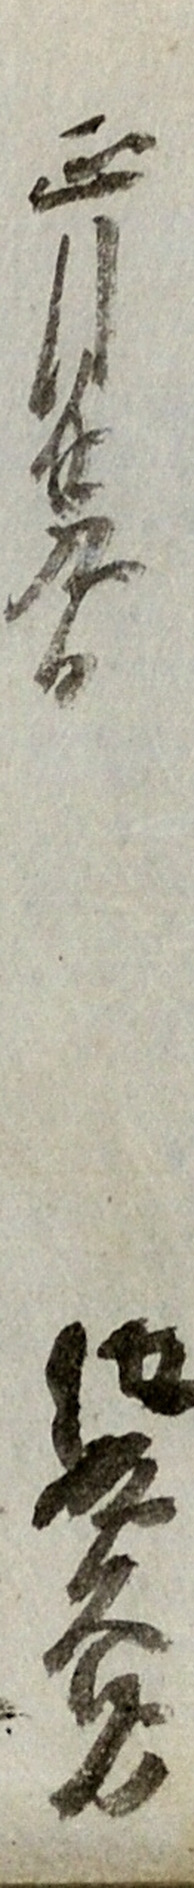正月廿九日佐藤久左衛門
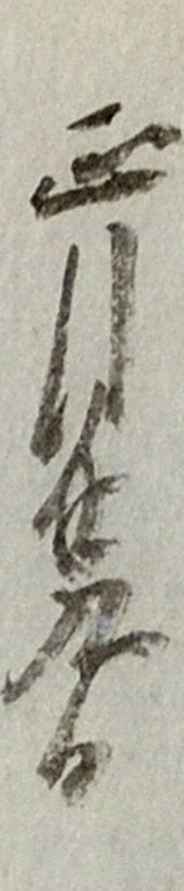正月廿九日
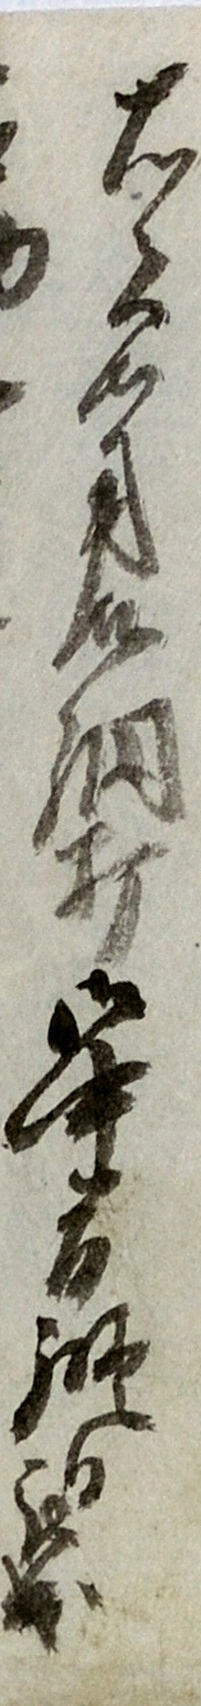右は御用御網打御中間終日罷出

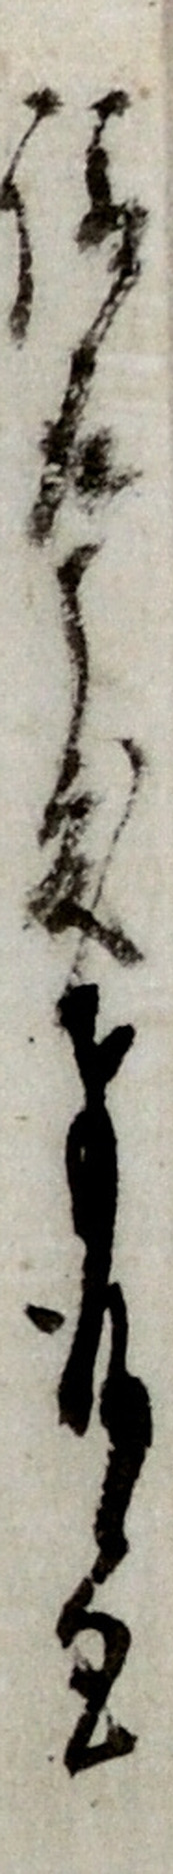請取申度奉存候以上
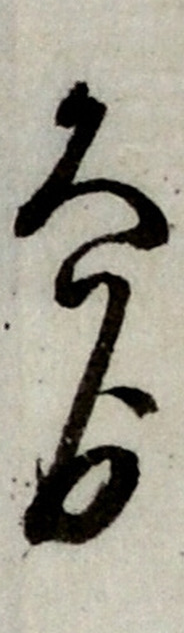弥右衛門
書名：分一方諸事御用留帳
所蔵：伊那市立高遠町図書館・合同会社AMANE
